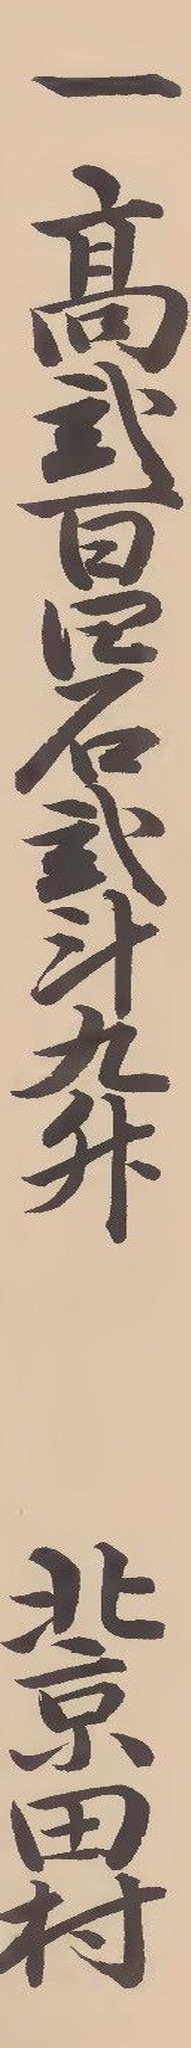一高弐百四石弐斗九升北京田村
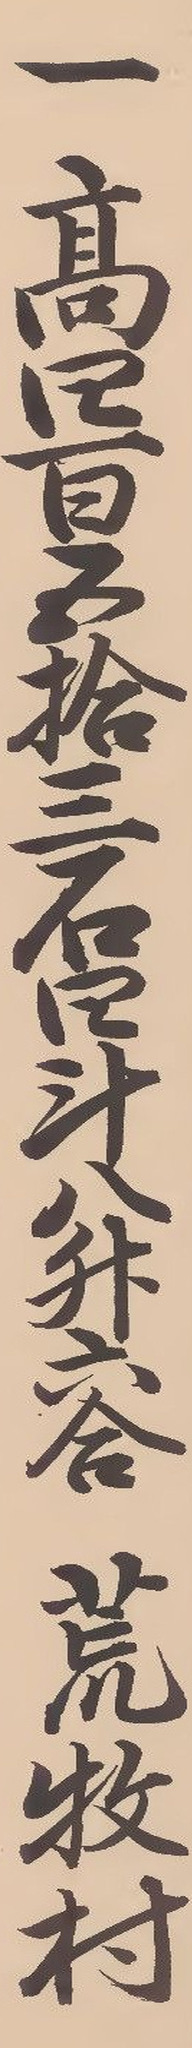一高四百五拾三石四斗八升六合荒牧村
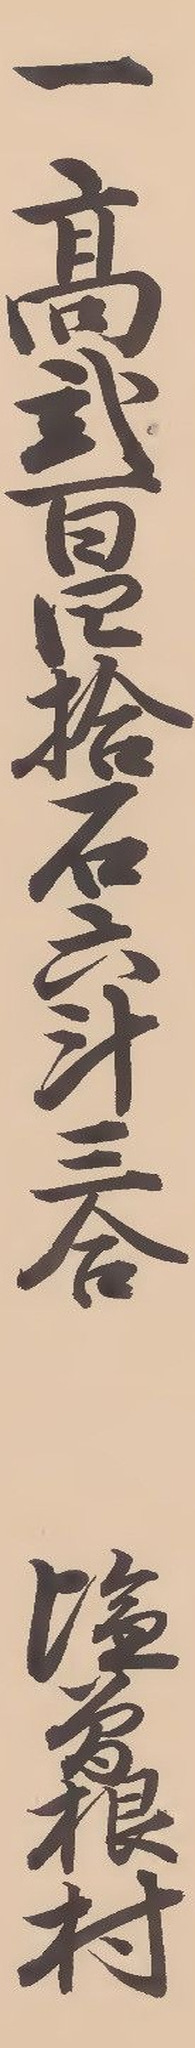一高弐百四拾石六斗三合塩曽根村
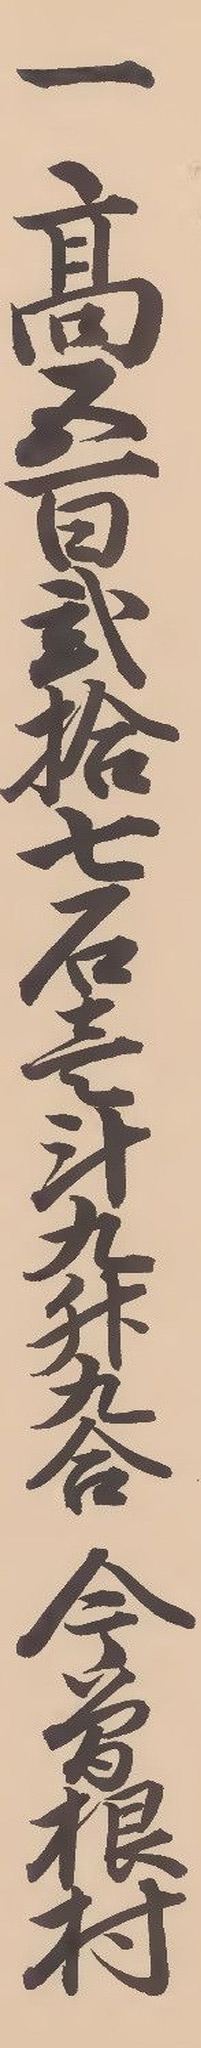一高五百弐拾七石壱斗九升九合今曽根村
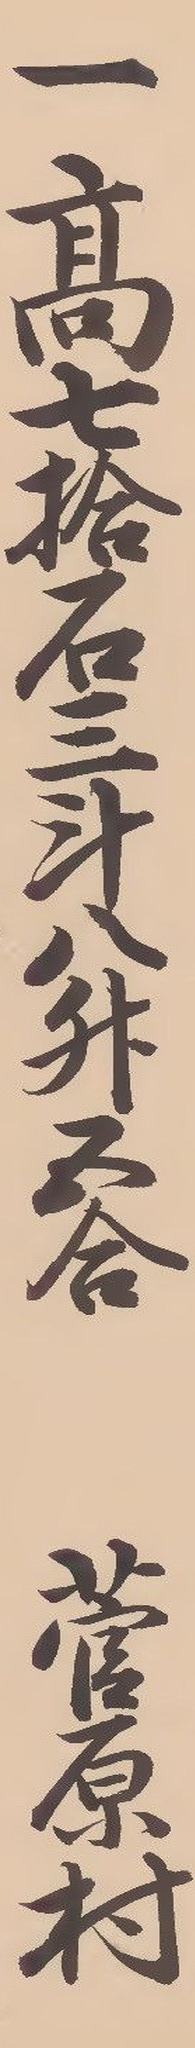一高七拾石三斗八升五合菅原村

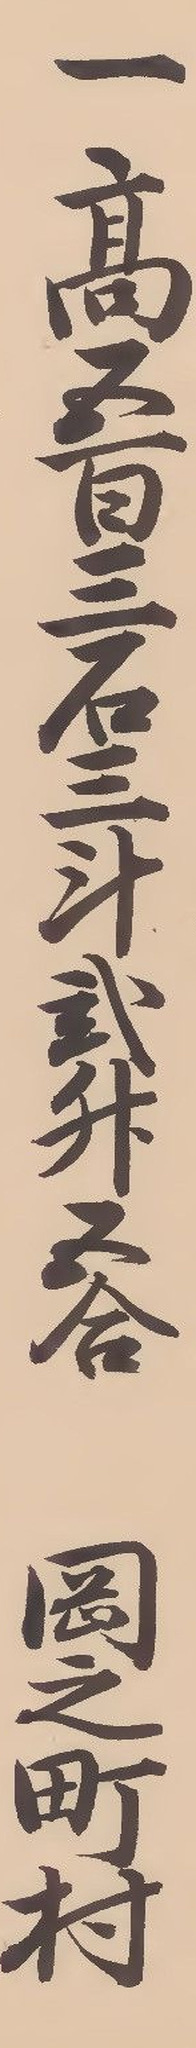一高五百三石三斗弐升五合岡之町村
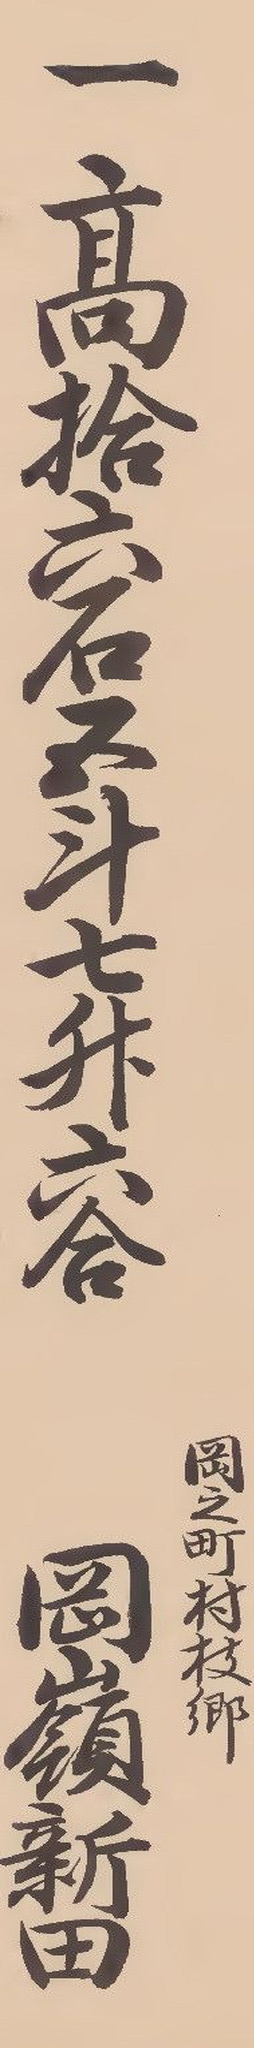一高拾六石五斗七升六合岡嶺新田
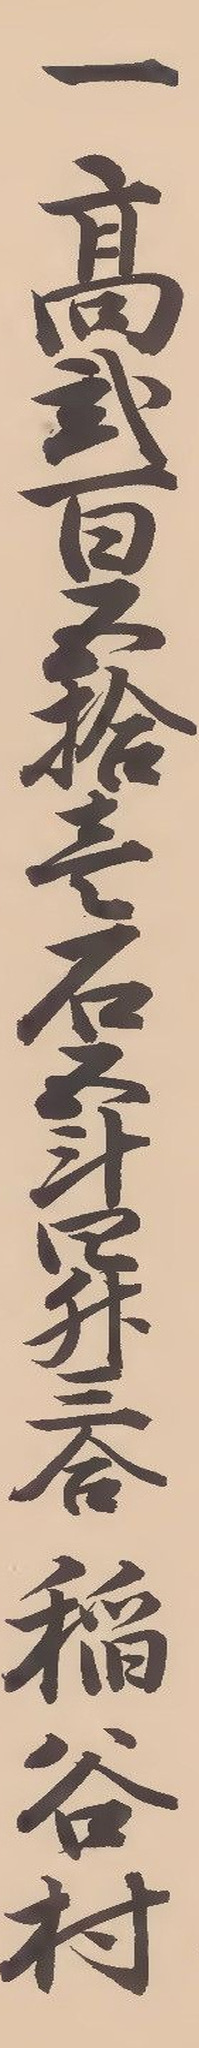一高弐百五拾壱石五斗四升三合稲谷村
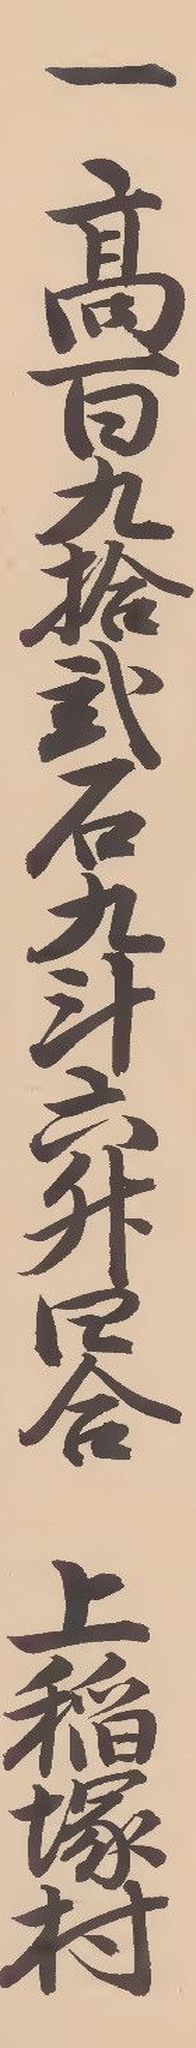一高百九拾弐石九斗六升四合上稲塚村
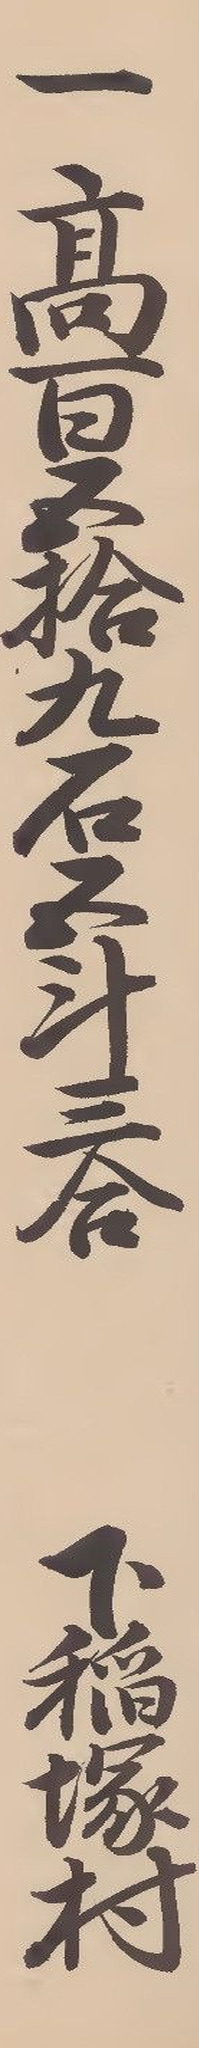一高百五拾九石五斗三合下稲塚村
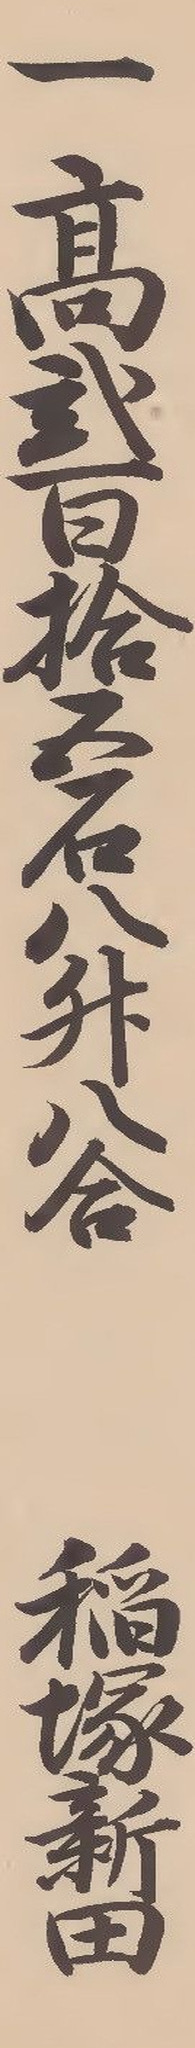一高弐百拾五石八升八合稲塚新田
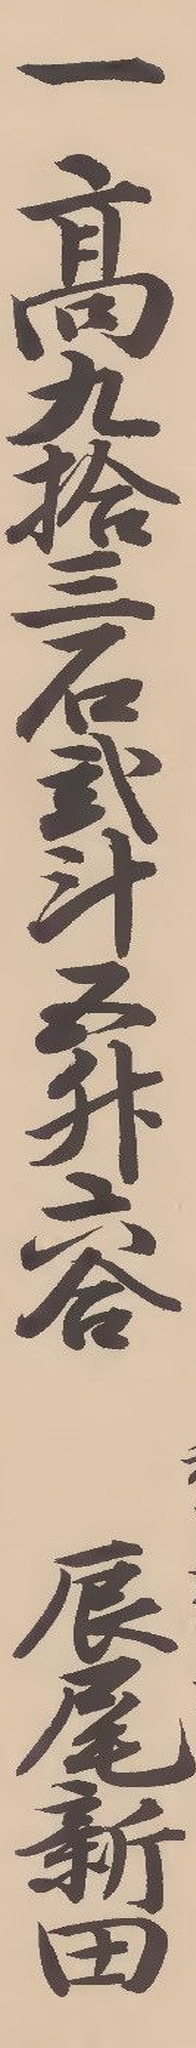一高九拾三石弐斗五升六合辰尾新田
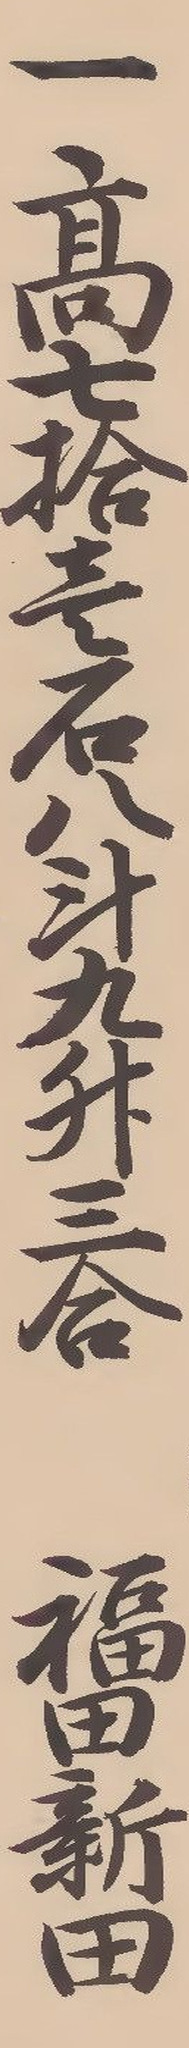一高七拾壱石八斗九升三合福田新田

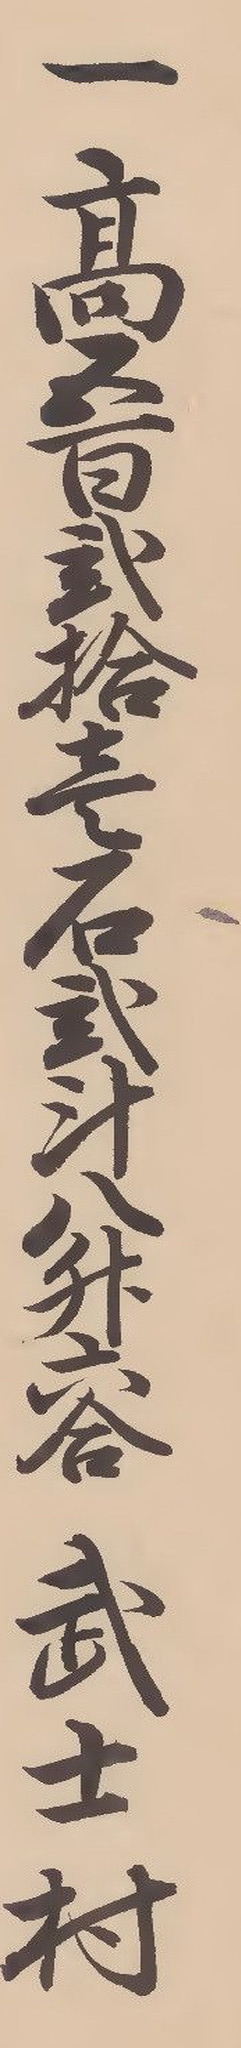一高五百弐拾壱石弐斗八升六合武士村
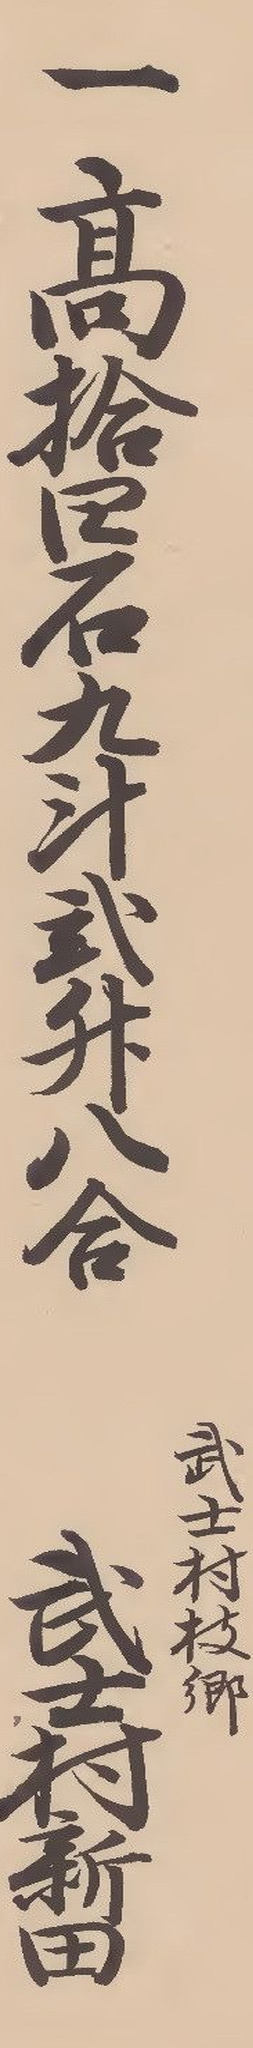一高拾四石九斗弐升八合武士村新田
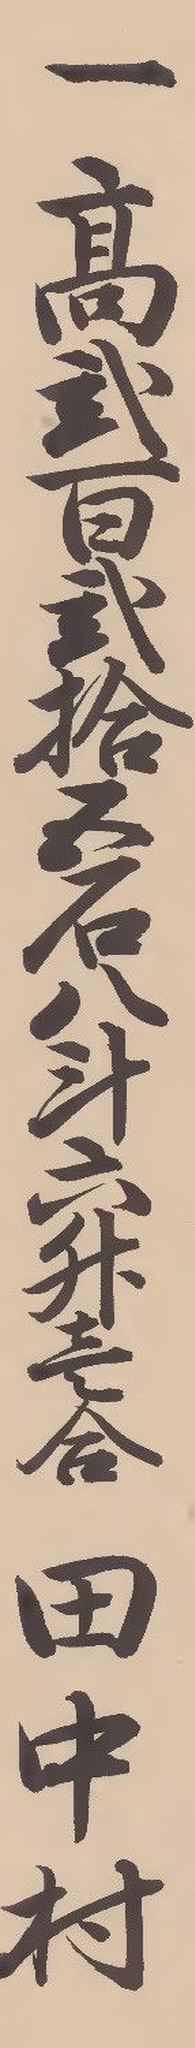一高弐百弐拾五石八斗六升壱合田中村
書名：越後国郷帳　上
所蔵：国立公文書館 National Archives of Japan
